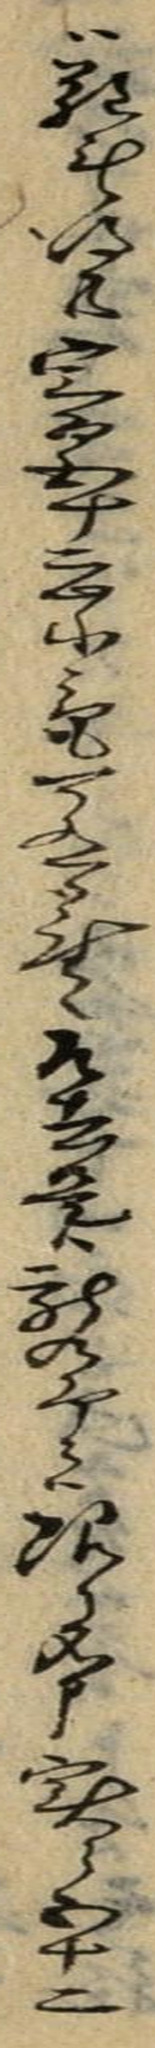ハ難斗候得共定而五十二歳ニ而も可有御座候乍去是ハ新九郎ニハ限り不申実者五十二
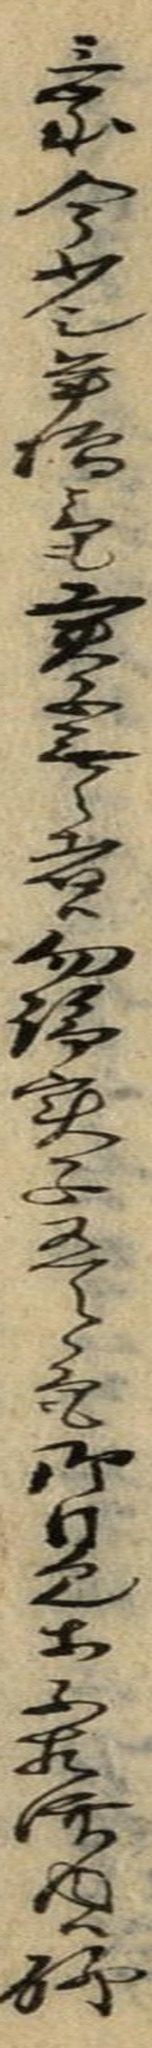三歳今少シ年増ニ而も実子無之者ハ勿論実子有之候而も御目見等不相済内ハ聊
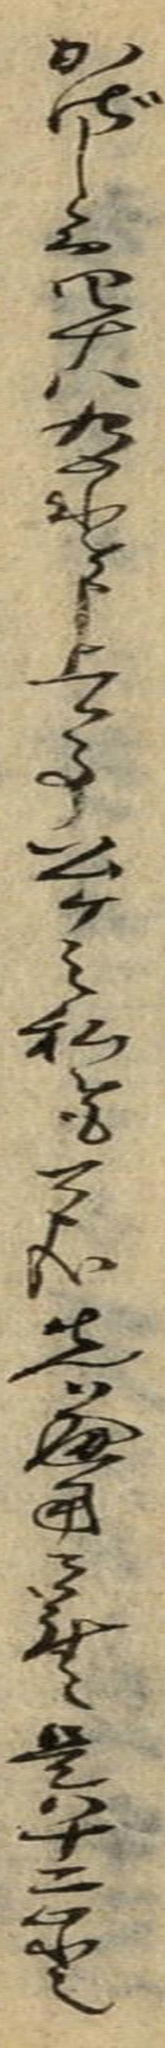かざし候而四十八九歳と申上候事公ケ之私とも可申哉先ハ通用ニ御座候是ハ十二歳之
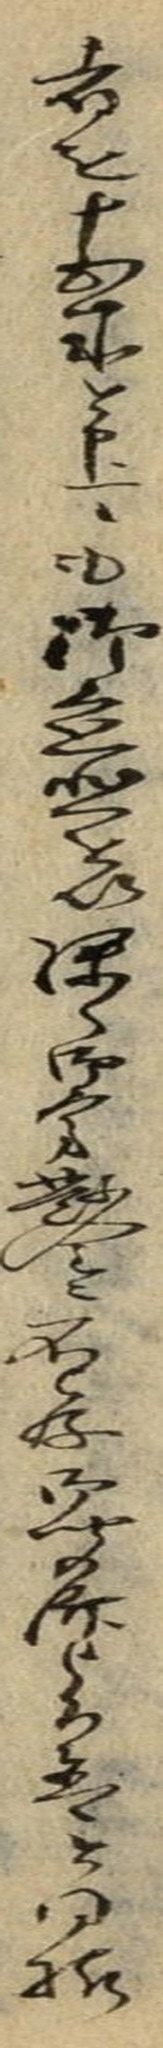者を十五歳と申上候も御慈悲を以深く御穿鑿ニ不被及御聞済被下置候と同様
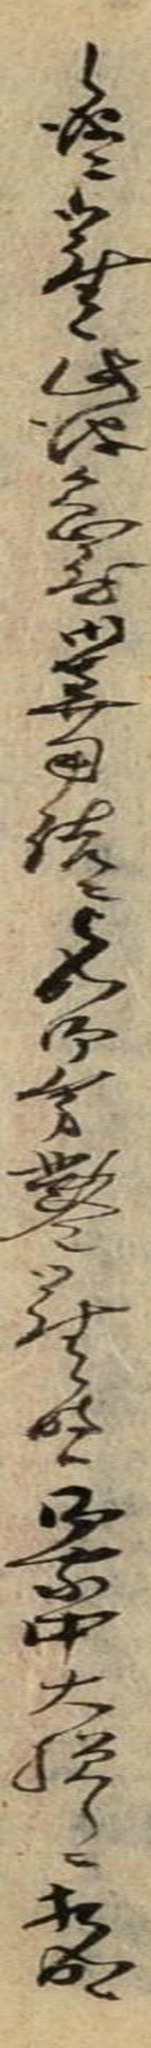之儀ニ御座候此儀急度御算用詰ニ被成御穿鑿御座候時ハ御家中大損しニ相成候
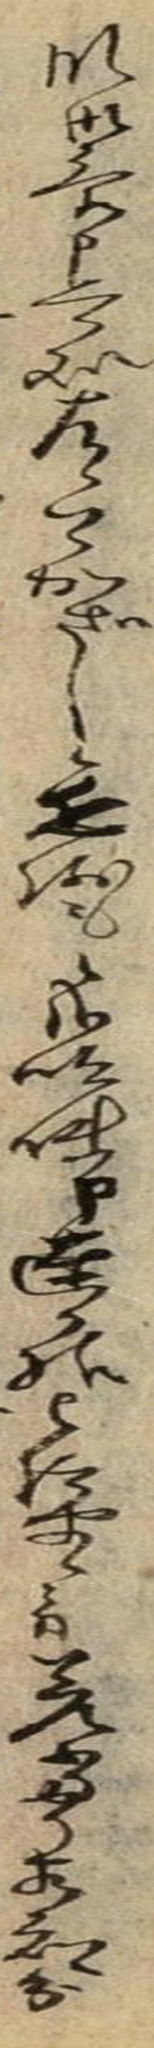段御答申上候処左候ハゝかざし候先例も候哉吟味申達候様被仰聞候二付差当り相知候分
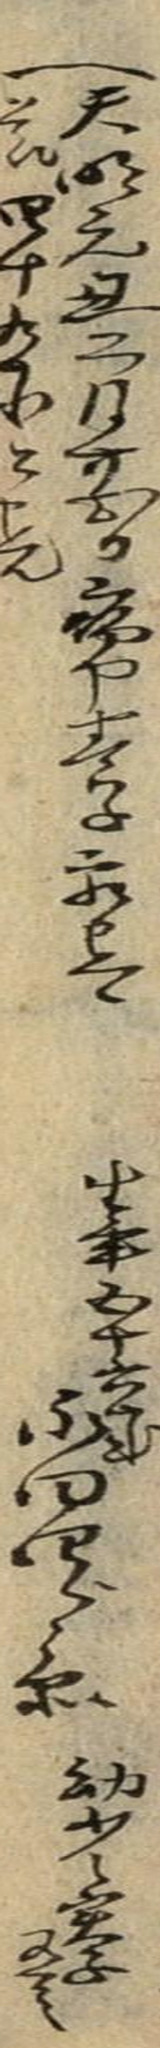天明元丑二月廿五日病中養子願申上候
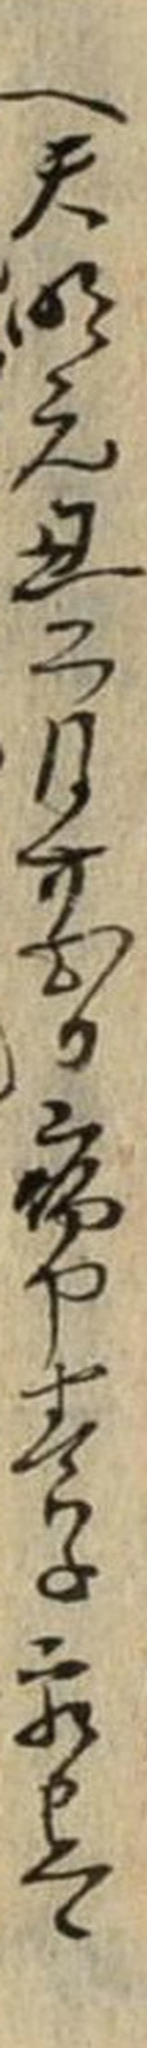天明元丑二月廿五日病中養子願申上候
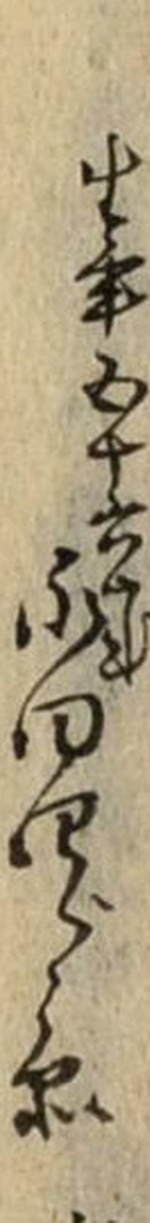生年五拾六歳
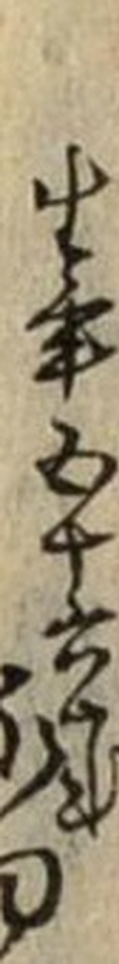生年五拾六歳
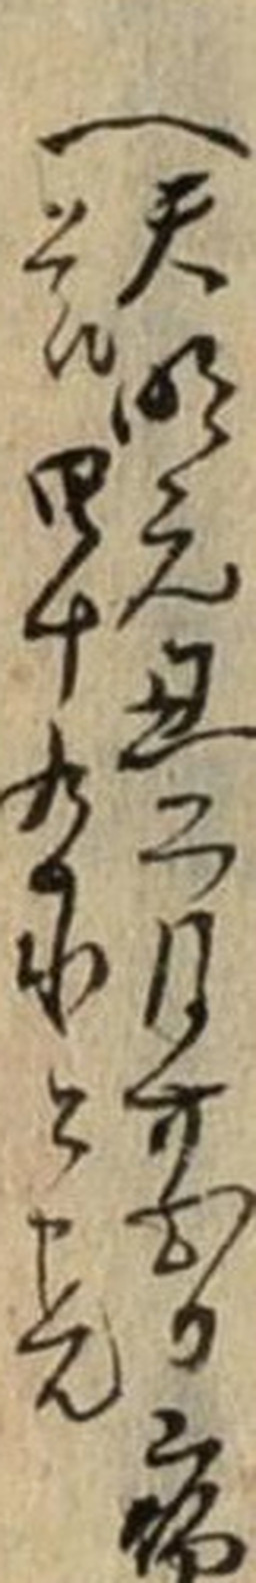節四十九歳と申上ル
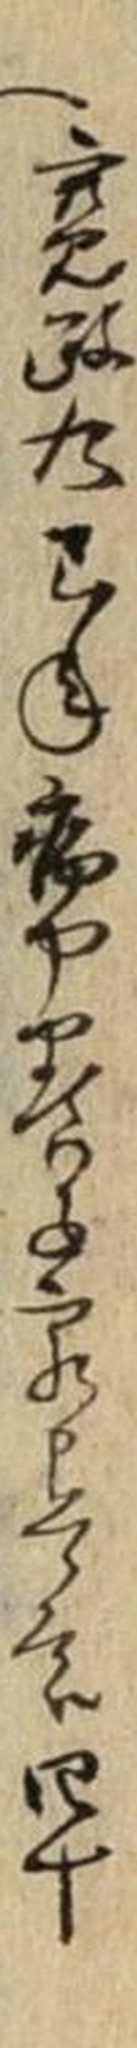寛政九巳年病中養子願申上候節四十
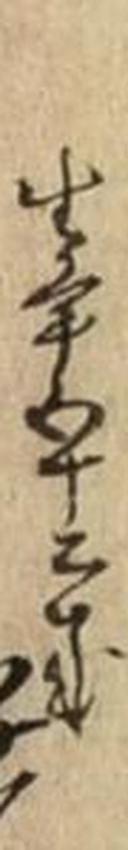生年五十二歳
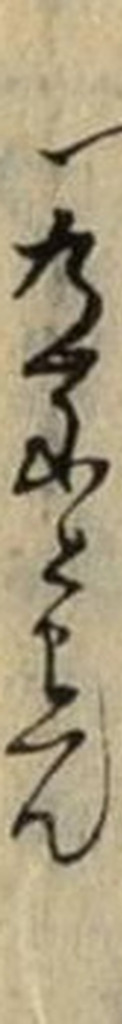九歳と申上ル
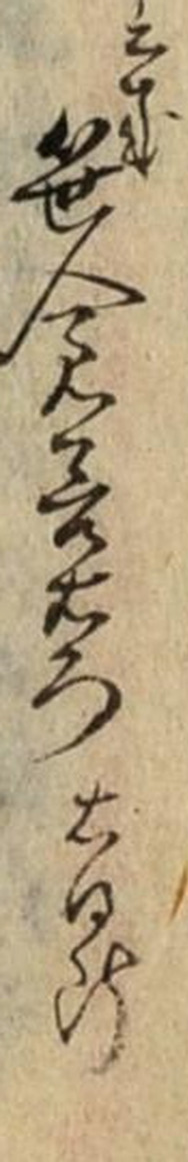笹倉善右衛門右同断
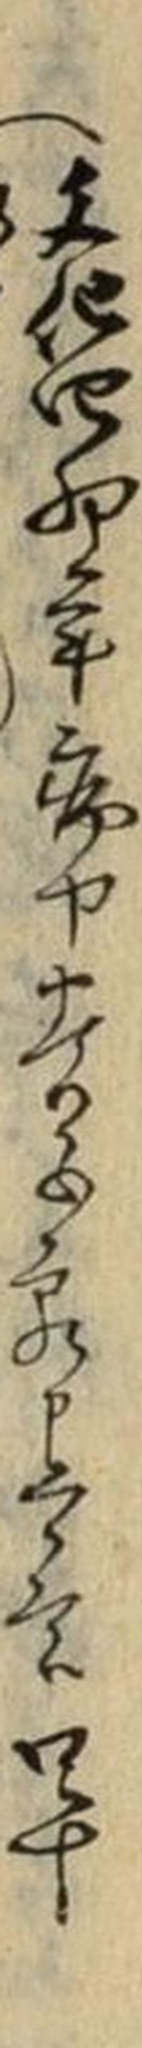文化四卯年病中養子願申上候節四十
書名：養子縁組之部
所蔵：福井県文書館 Fukui Prefectural Archives
